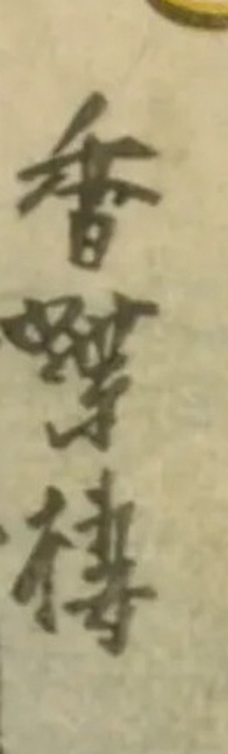香蝶棲
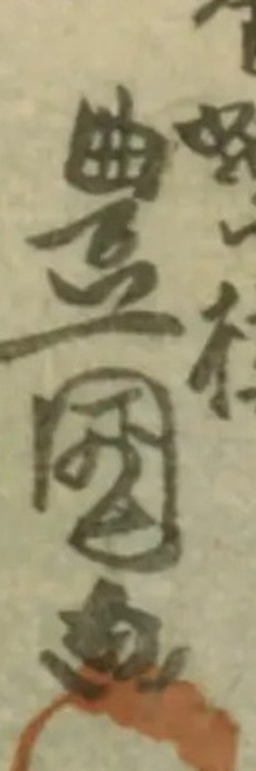豊国画
